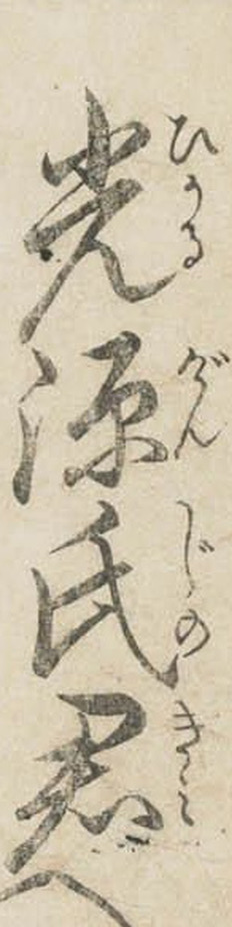光源氏君
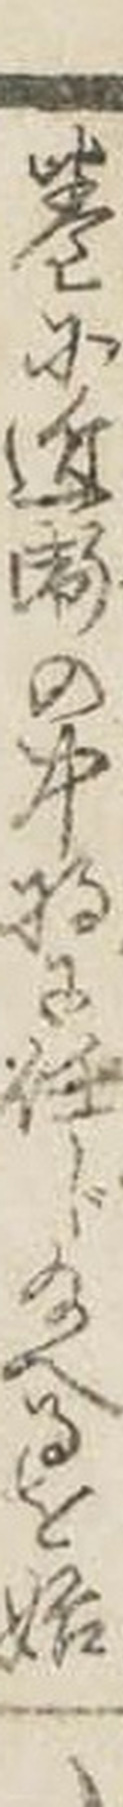巻に近衛の中将に任じ給へるを始
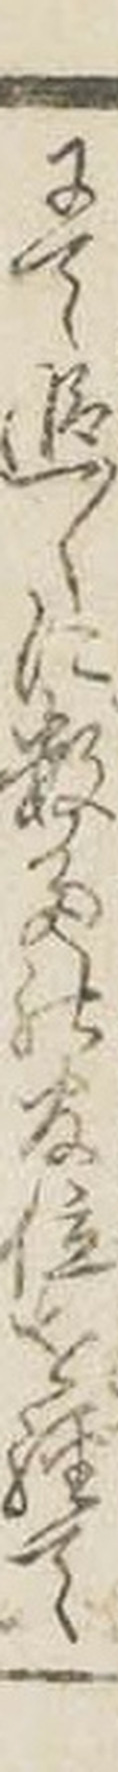にて追〳〵に数多の官位を経て
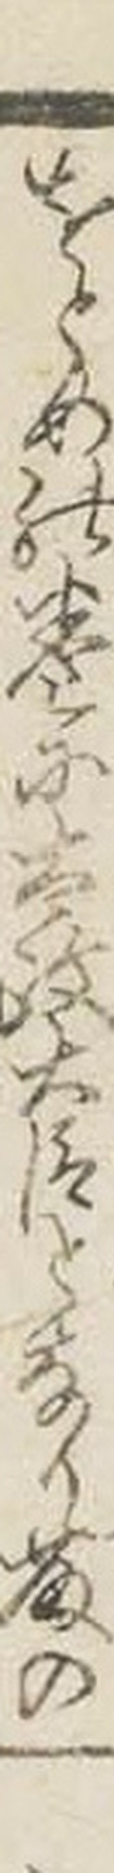をとめの巻に太政大臣となり藤の
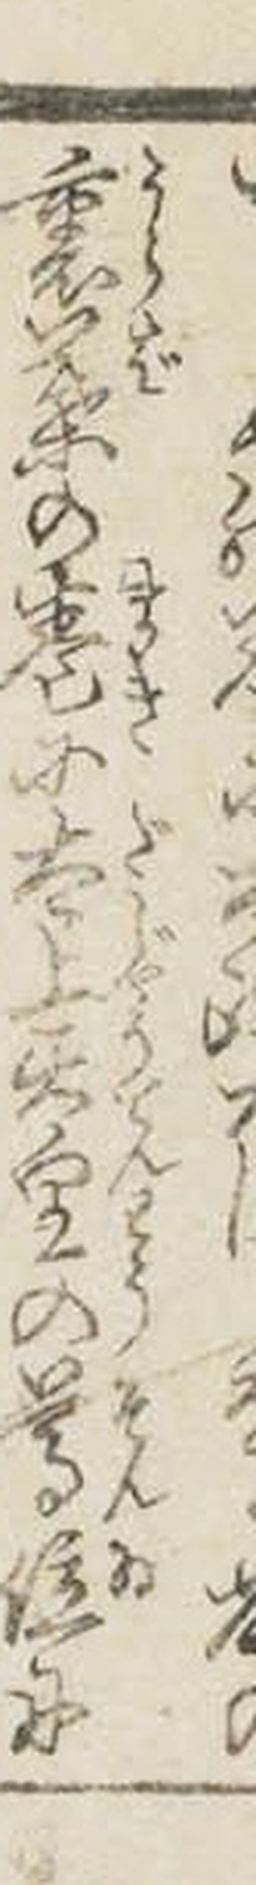裏葉の巻に太上天皇の尊位に
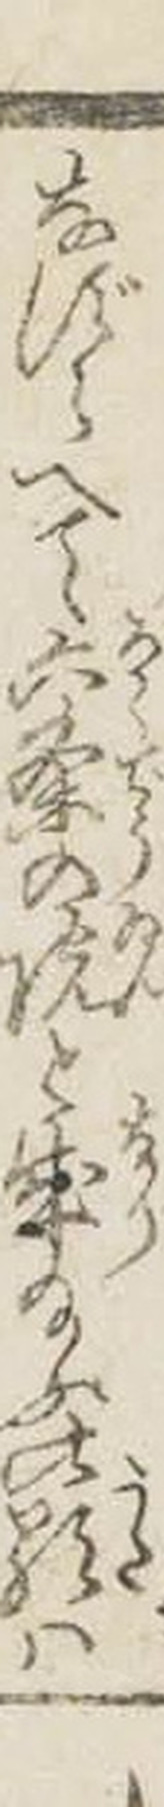なずらへて六条の院と成給ふ此歌は
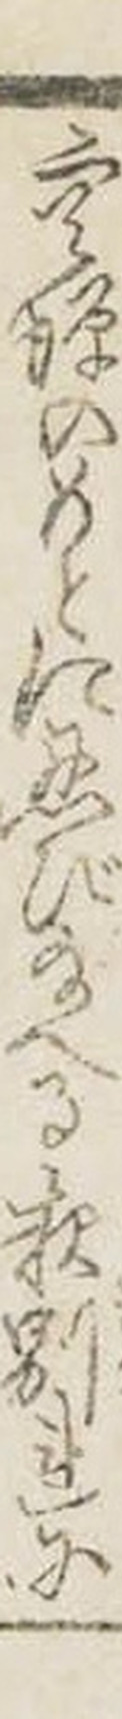空蝉のもとに忍び給へる夜別れに
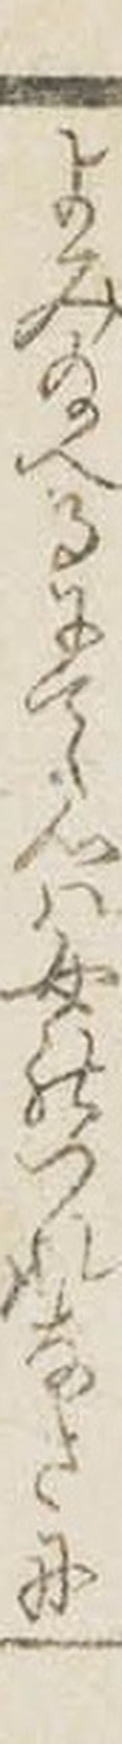よみ給へるにて心は女のつれなさに
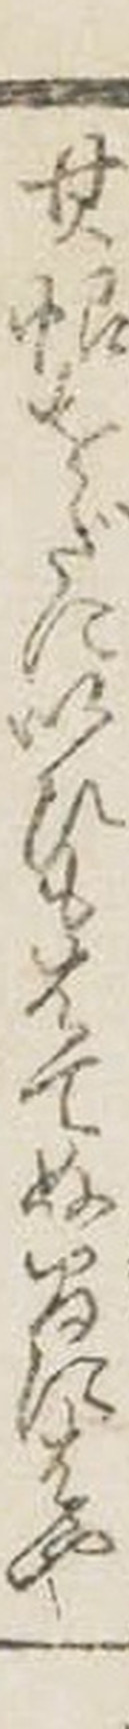其恨をだにいひもはてぬ間にはや
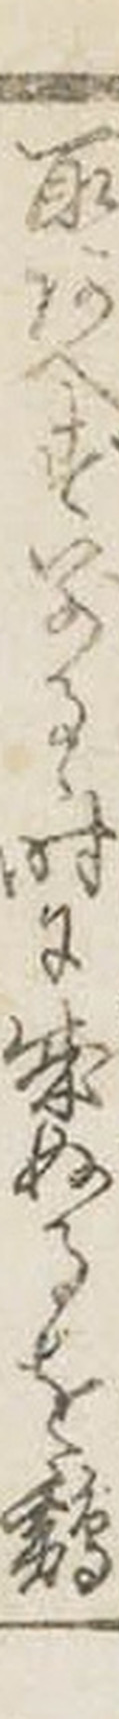取あへず別るゝ時に成ぬるを鶏
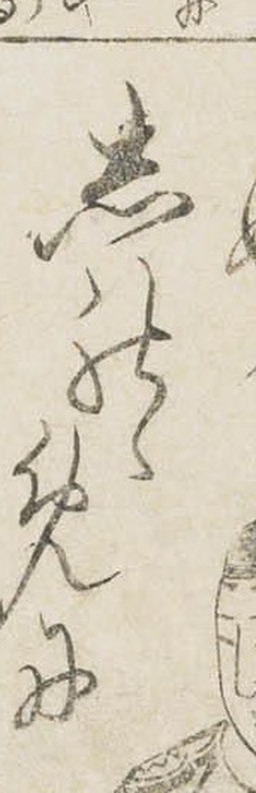しのゝめに
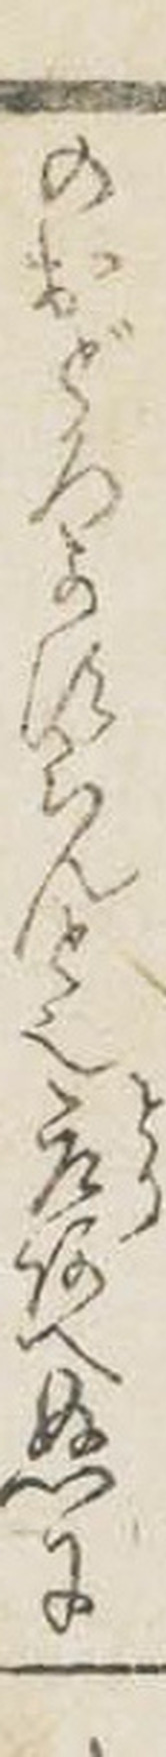のおどろかすらんと也取あへぬに
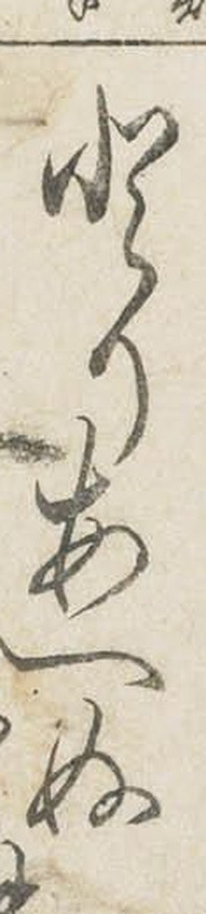とりあへぬ
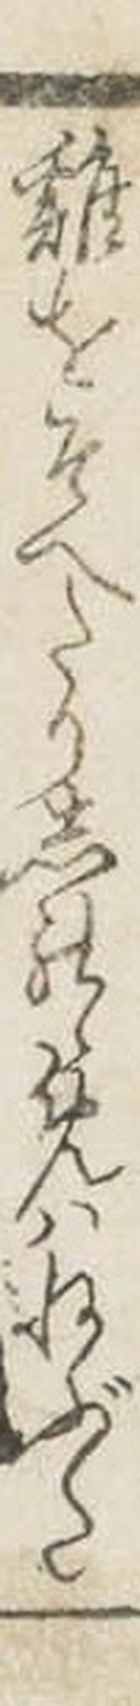雞をそへたりしのゝめはねぶた
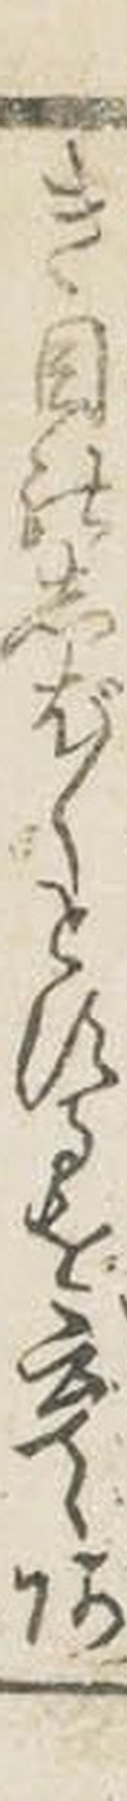き目のしば〳〵とするを云てあ
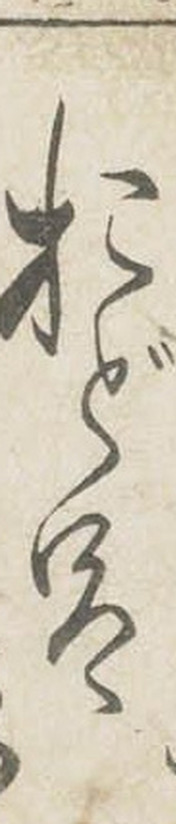おどろ
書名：源氏百人一首
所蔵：東京学芸大学教育コンテンツアーカイブ
